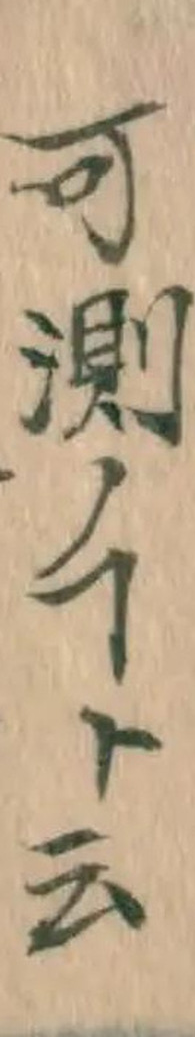可測ノコトト云
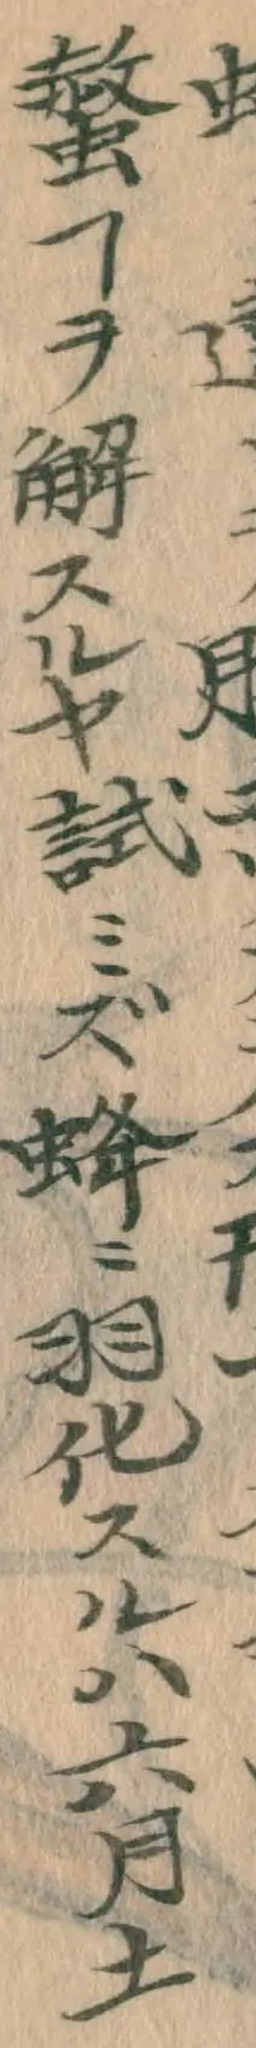螫コトヲ解スルヤ試ミズ蜂ニ羽化スルハ六月土
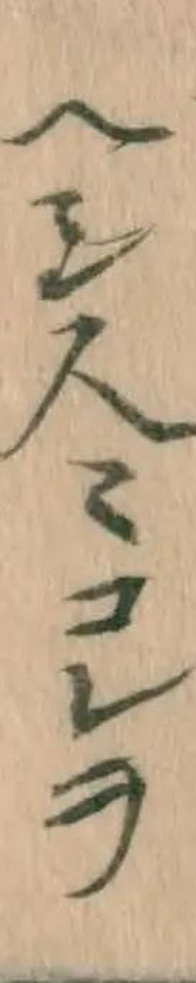ヘシ人々コレヲ
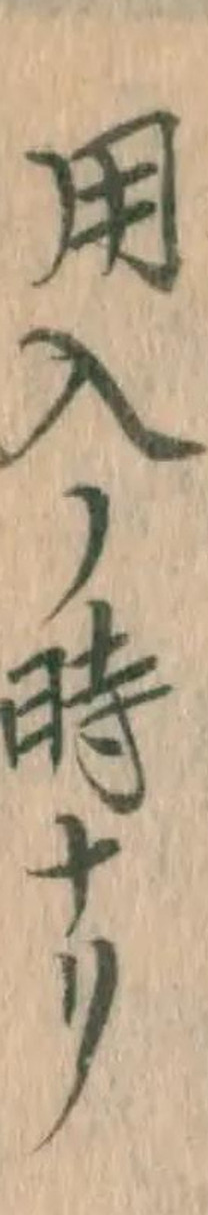用入ノ時ナリ
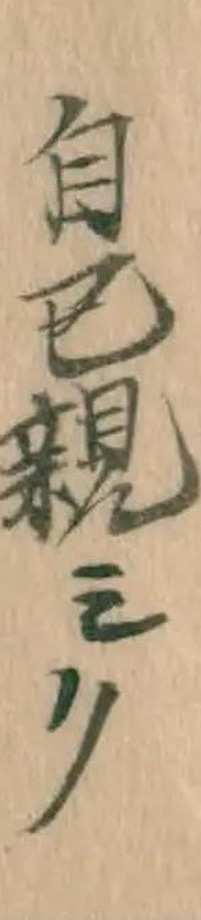自己親シク
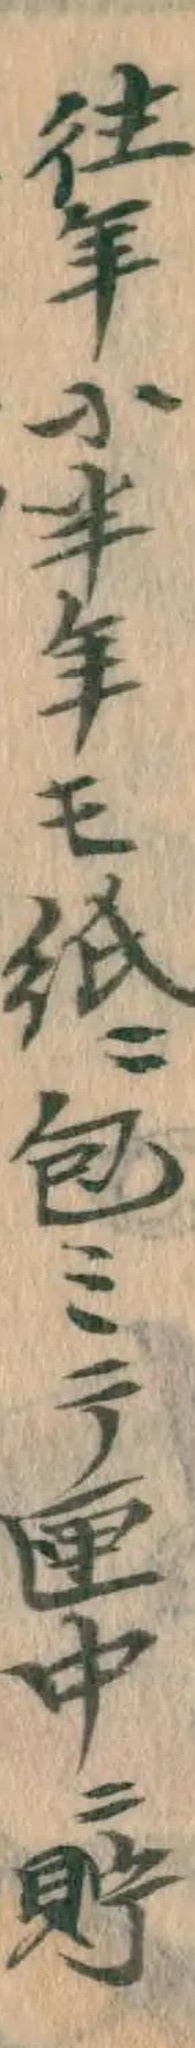往年小半年モ紙ニ包ミテ匣中ニ貯
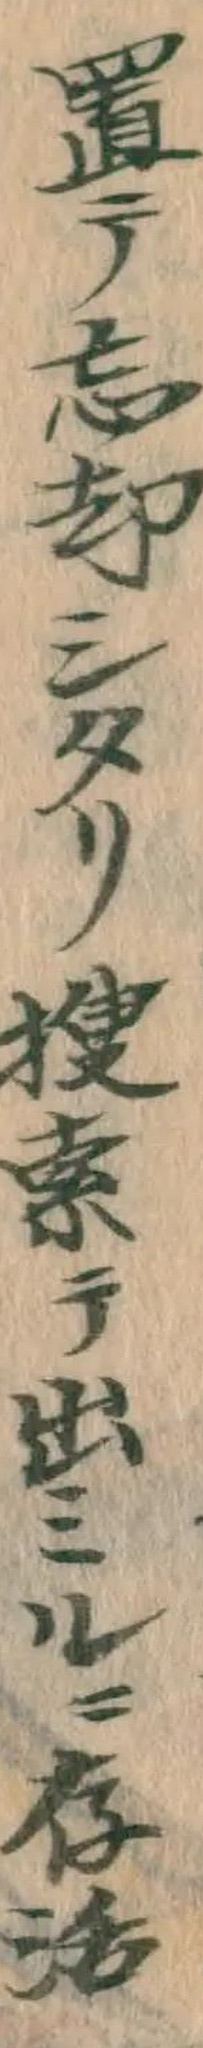置テ忘却シタリ捜索テ出ミルニ存活
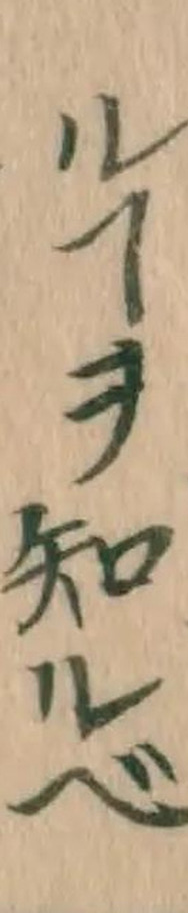ルコトヲ知ルベ
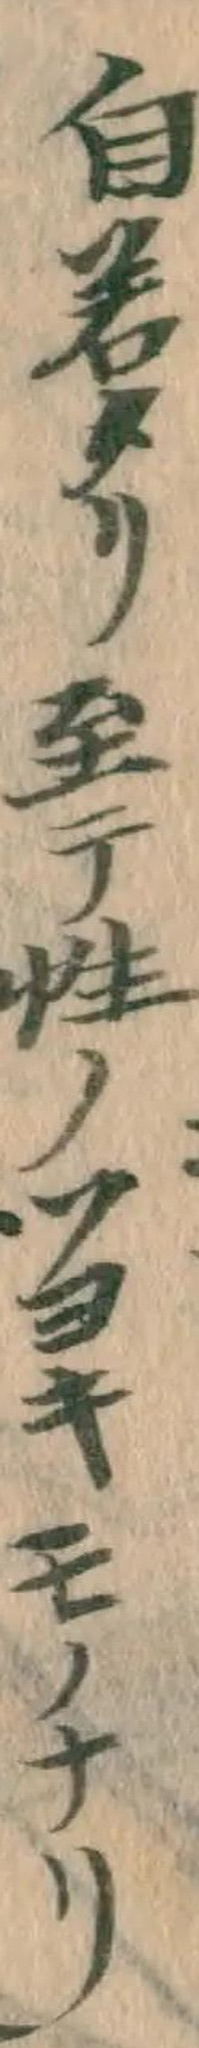自若タリ至テ性ノツヨキモノナリ
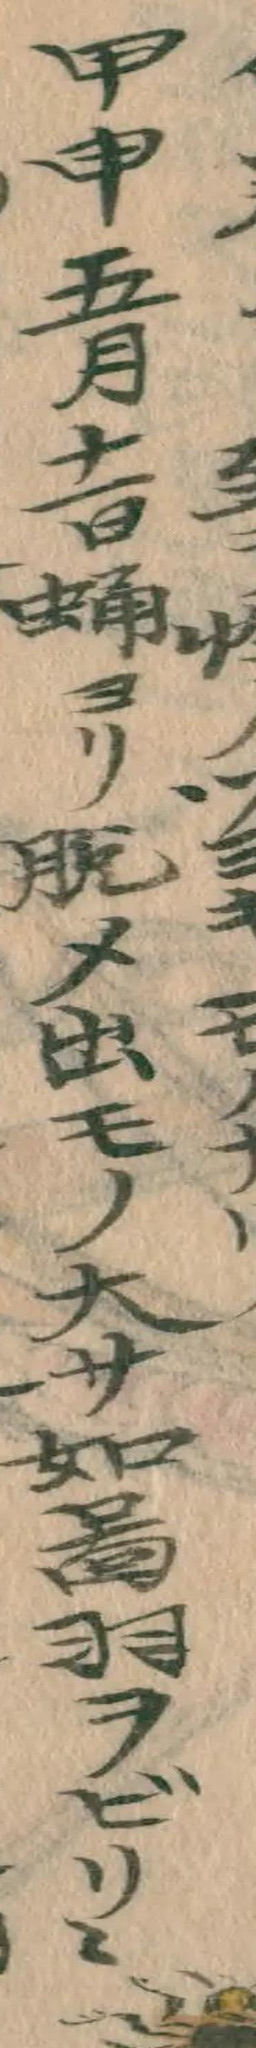甲申五月十一日蛹ヨリ脱シテ出モノ大サ如啚羽ヲビリ〳〵
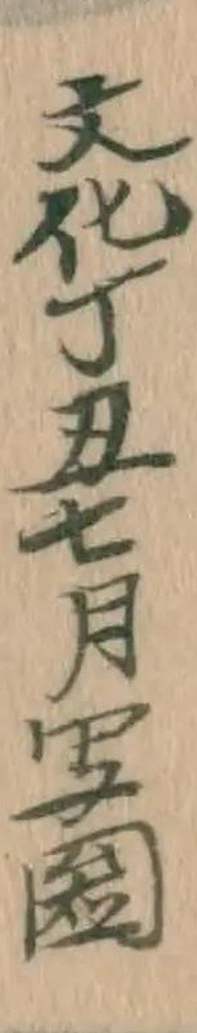文化丁丑七月写圖
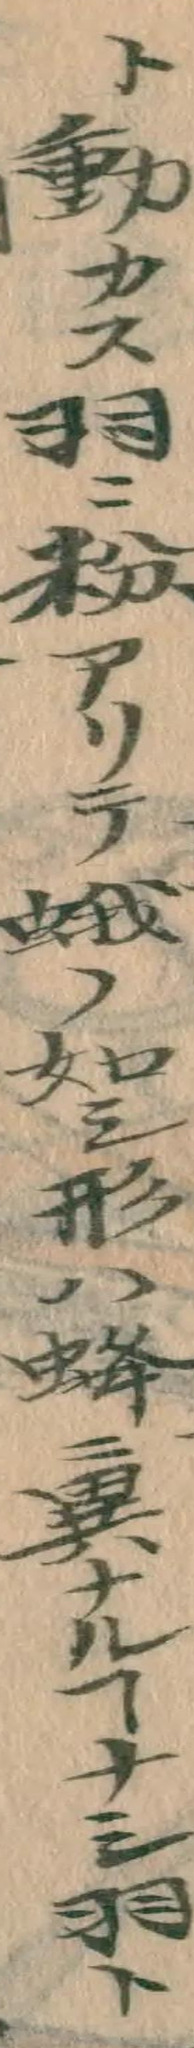ト動カス羽ニ粉アリテ蛾ノ如シ形ハ蜂ニ異ナルコトナシ羽ト
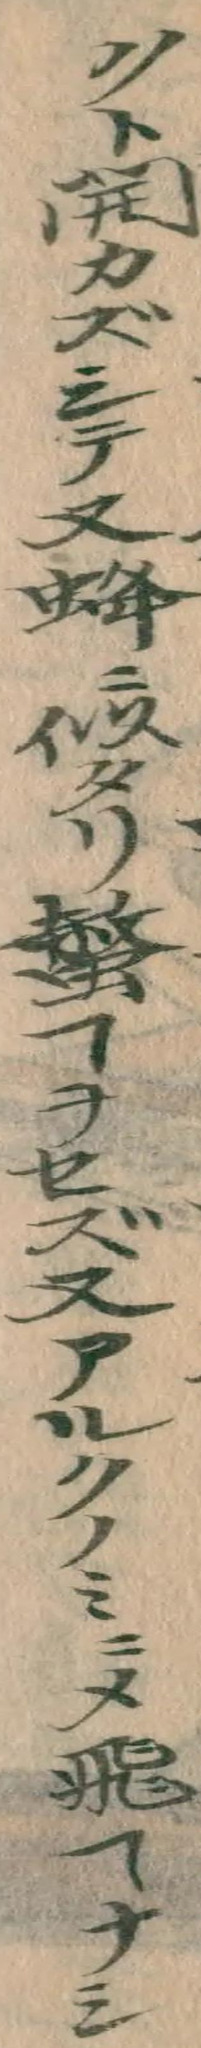クト開カズシテ又蜂ニ似タリ螫コトヲセズ又アルクノミニシテ飛コトナシ
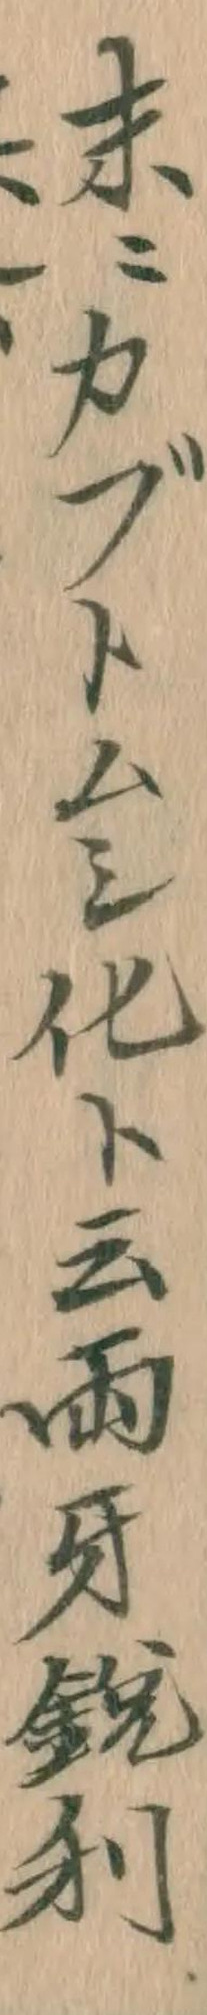末ニカブトムシ化ト云両牙鋭利
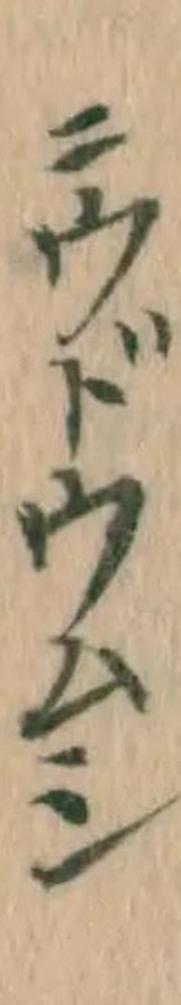ニウドウムシ
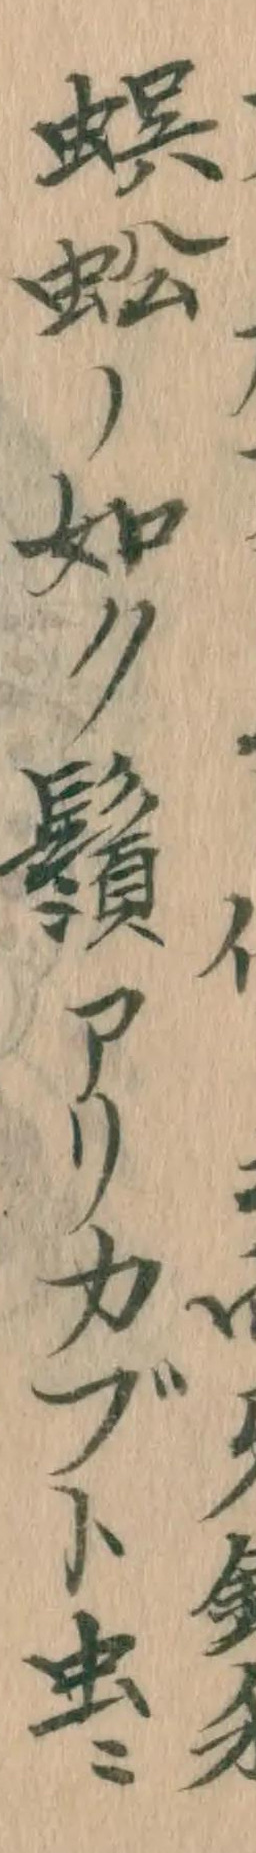蜈蚣ノ如ク鬚アリカブト虫ニ
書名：千蟲譜 3巻. [2]
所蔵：国立国会図書館 National Diet Library, JAPAN
